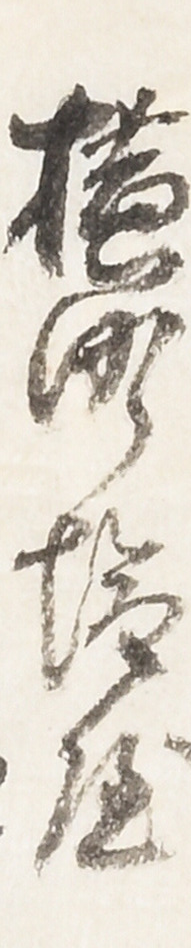横町塩屋
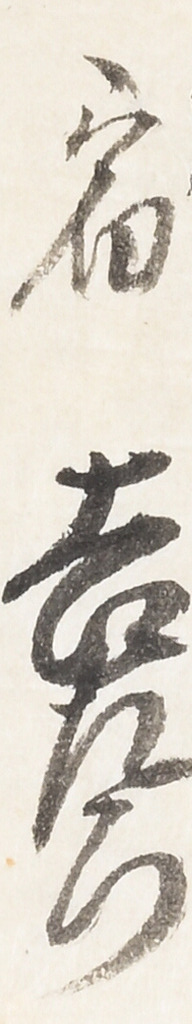宿吉左衛門
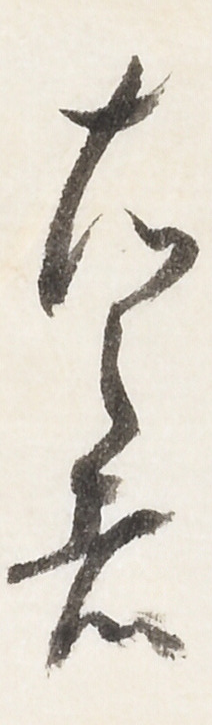右之者
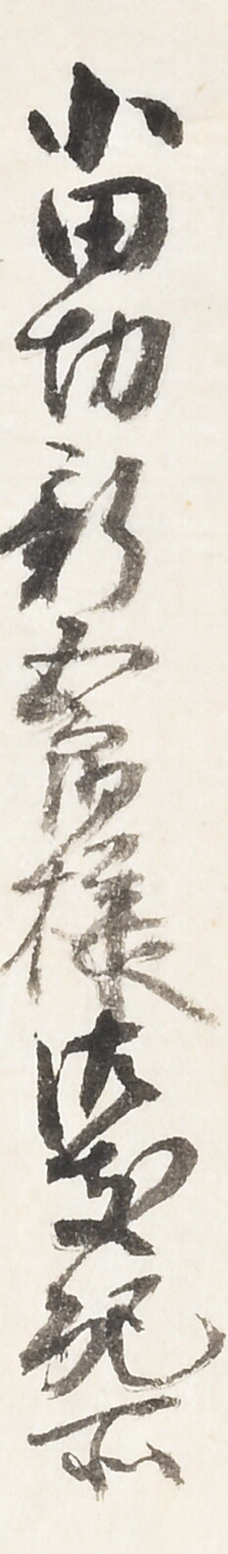小田切新五郎様御支配所
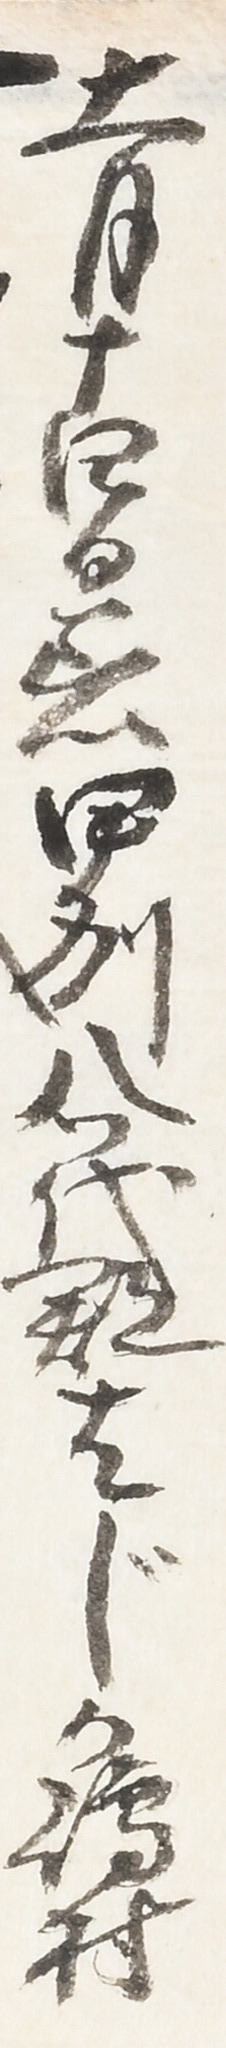十一月十四日甲州八ツ代郡はじか嶋村
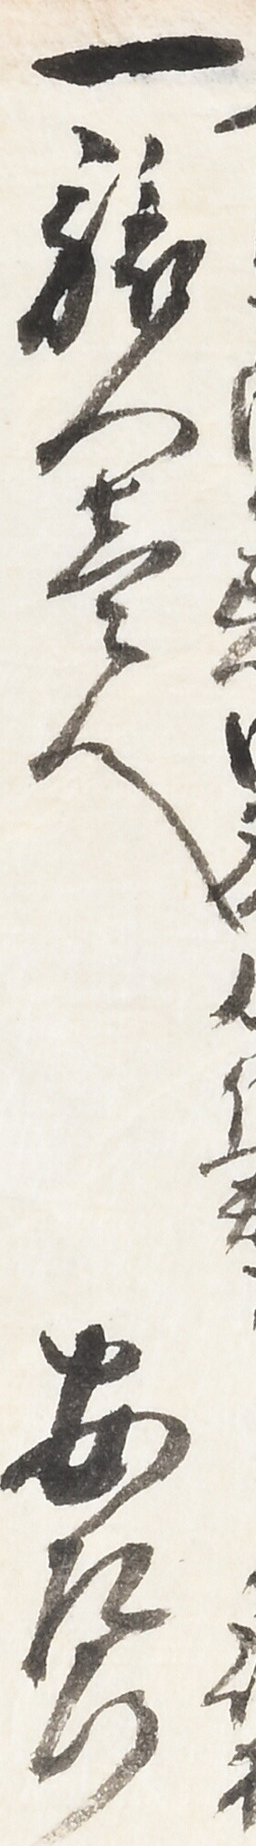一旅人壱人安左衛門
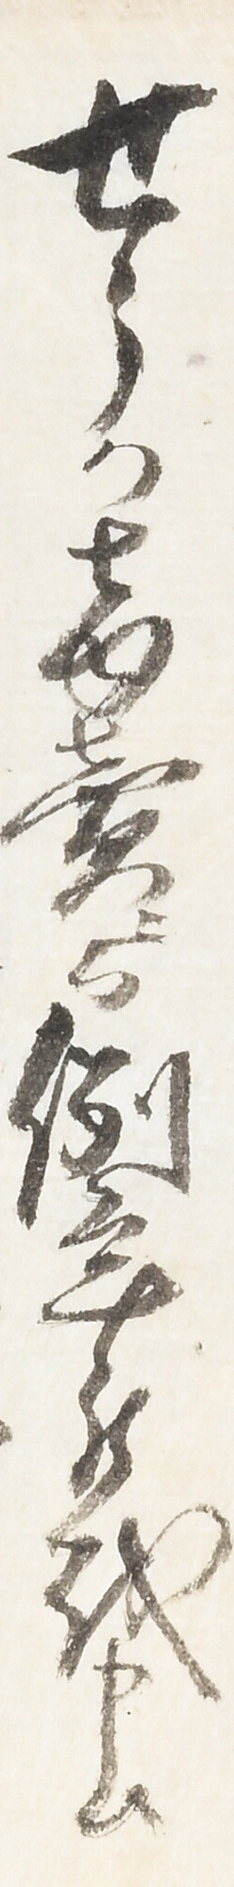せうか商売ニ而例年罷越申候
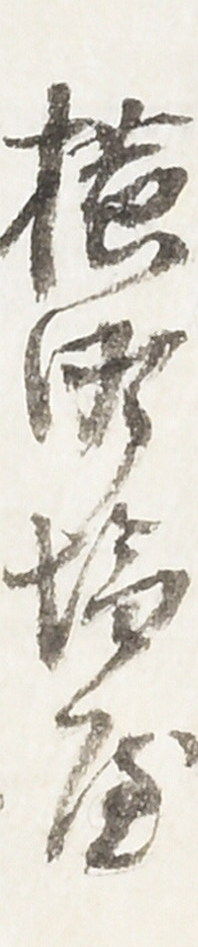横町塩屋
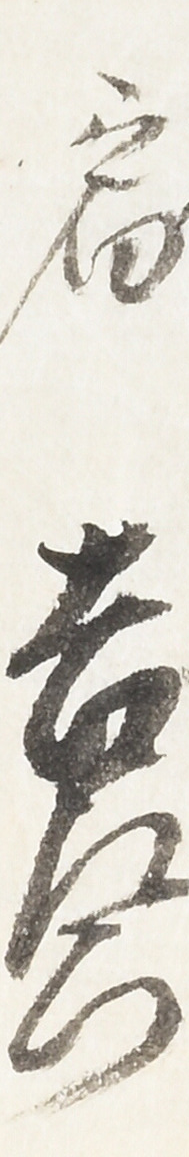宿吉左衛門
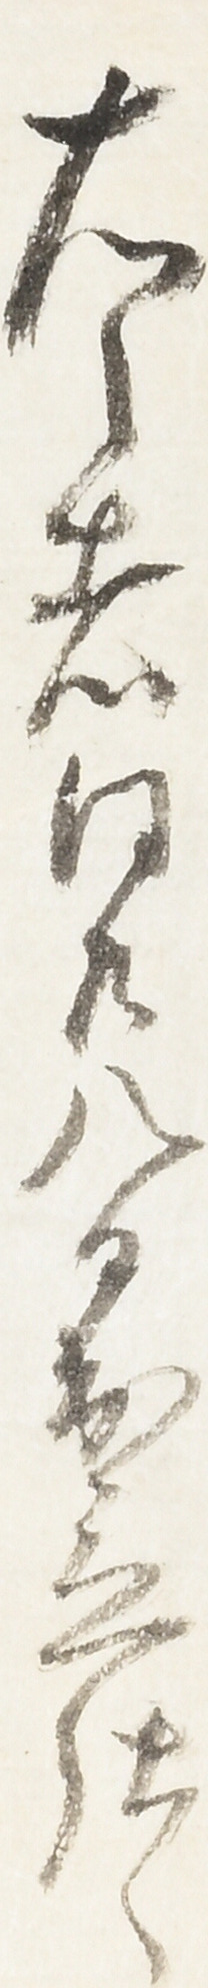右之者同廿八日出立仕候
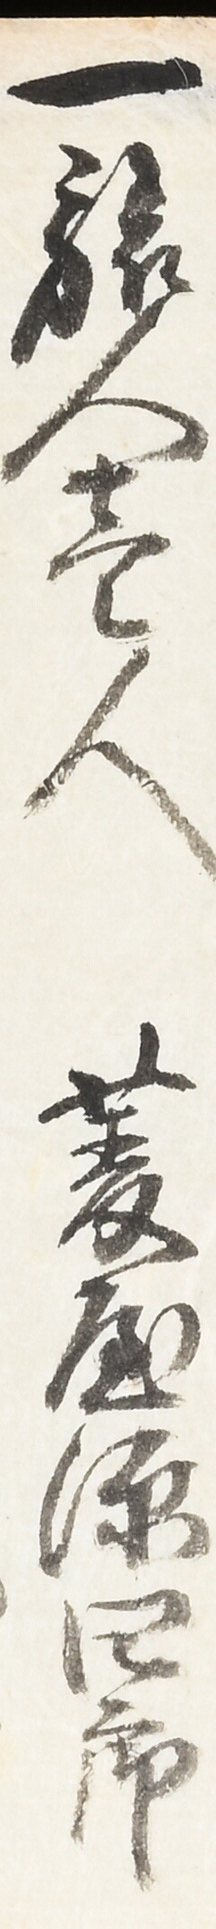一旅人壱人菱屋源四郎
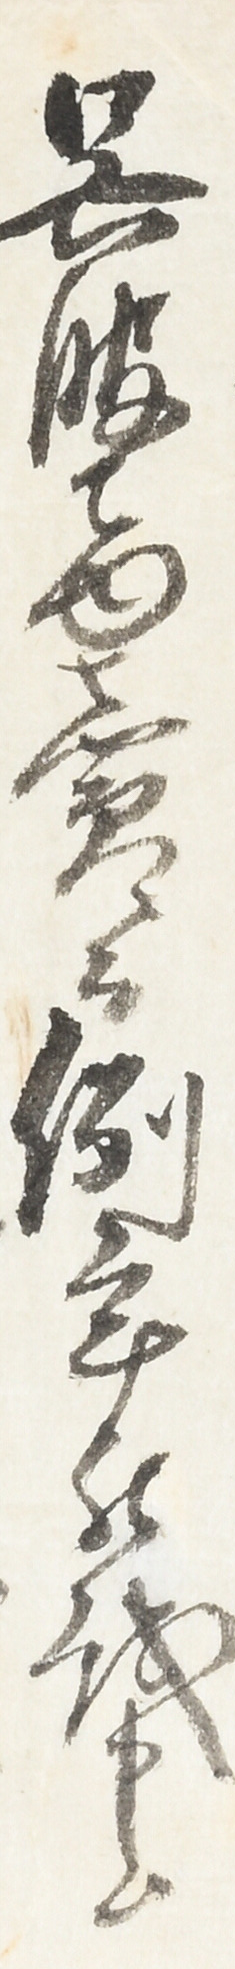呉服商売ニ而例年罷越申候
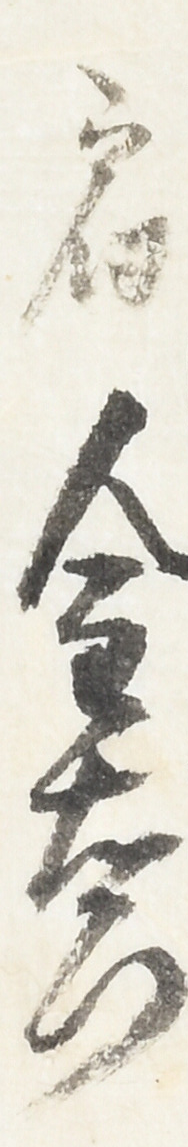宿金右衛門
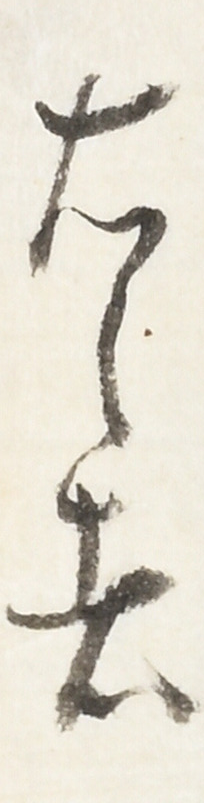右之者

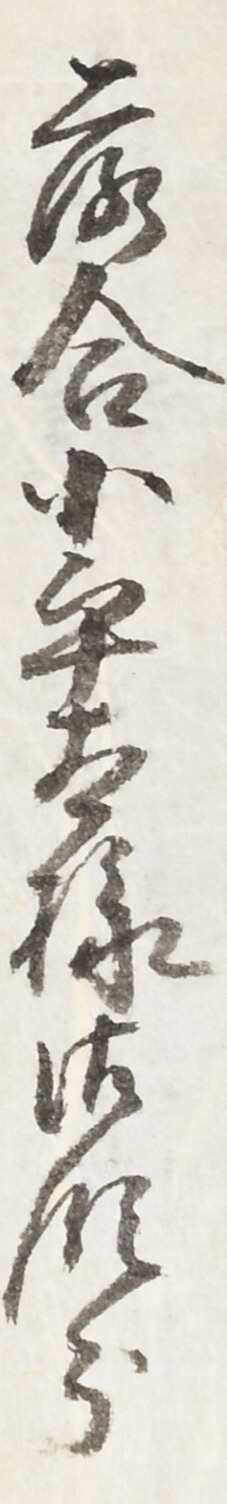落合小平太様御領分
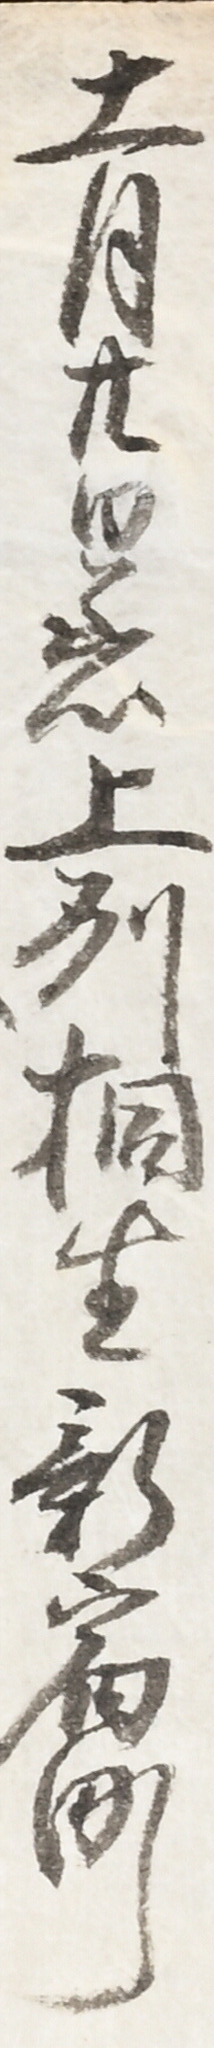十一月廿日着上州桐生新宿町
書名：旅人泊控帳
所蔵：伊那市立高遠町図書館・合同会社AMANE
